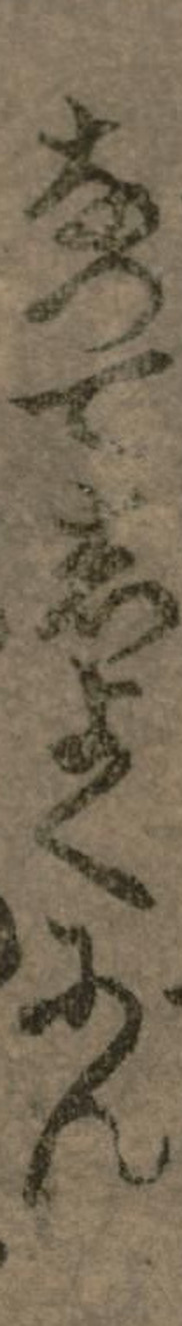なつてしよくにん
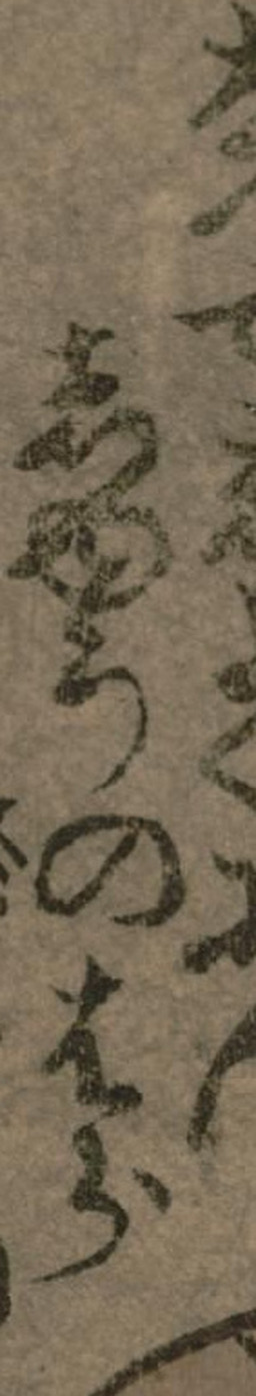しやうのはら
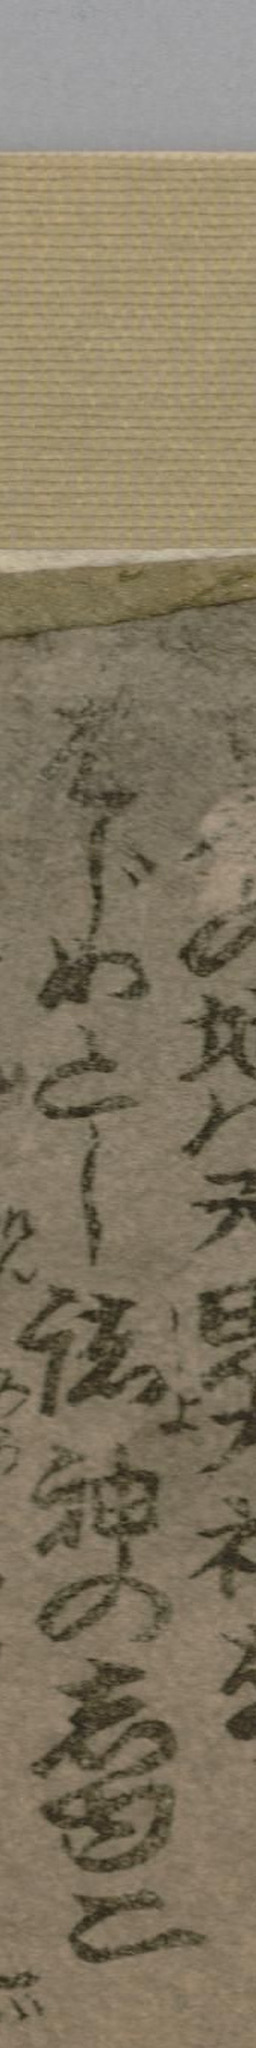はじめとし諸神のしゆこ
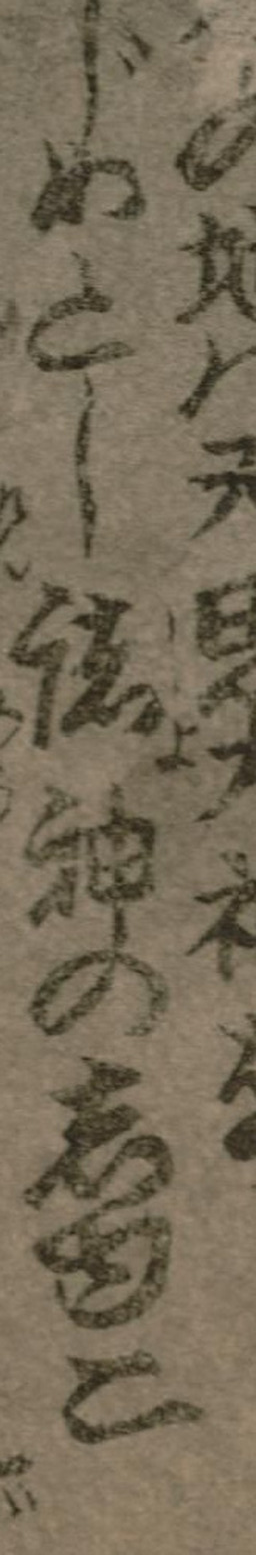はじめとし諸神のしゆこ
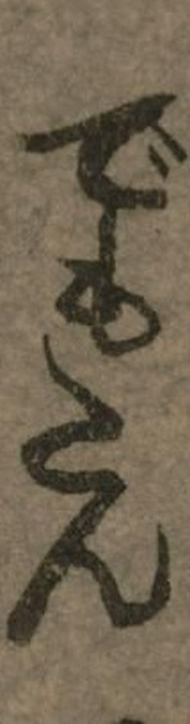でもたん
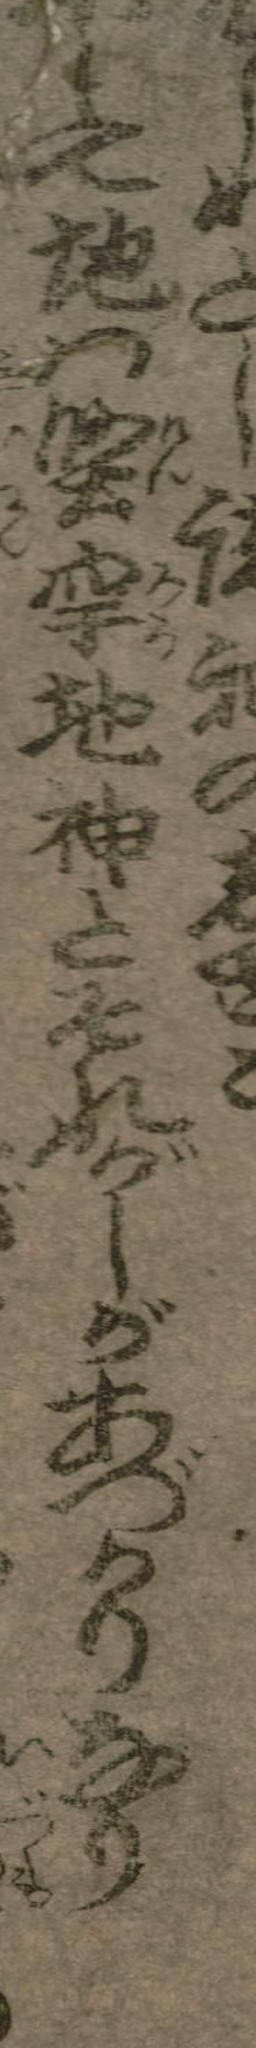にして地は堅牢地神とそれがしがあづかりなり
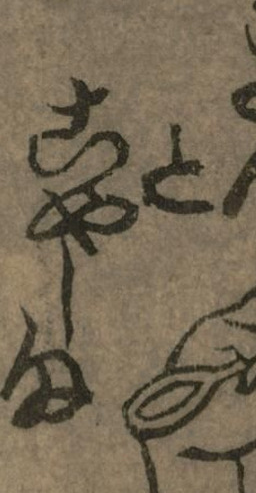こやしま
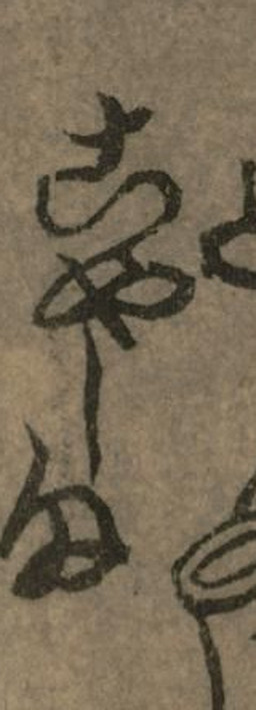こやしま
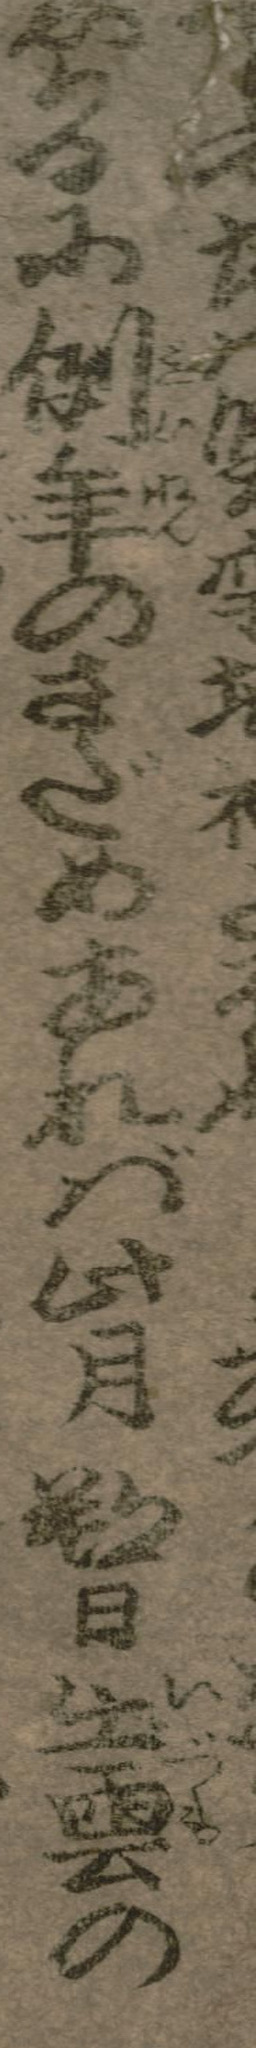しかるに例年のさだめあれば此月朔日出雲の
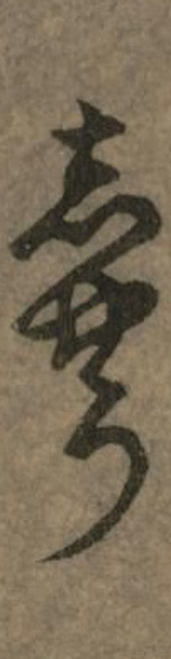しやう
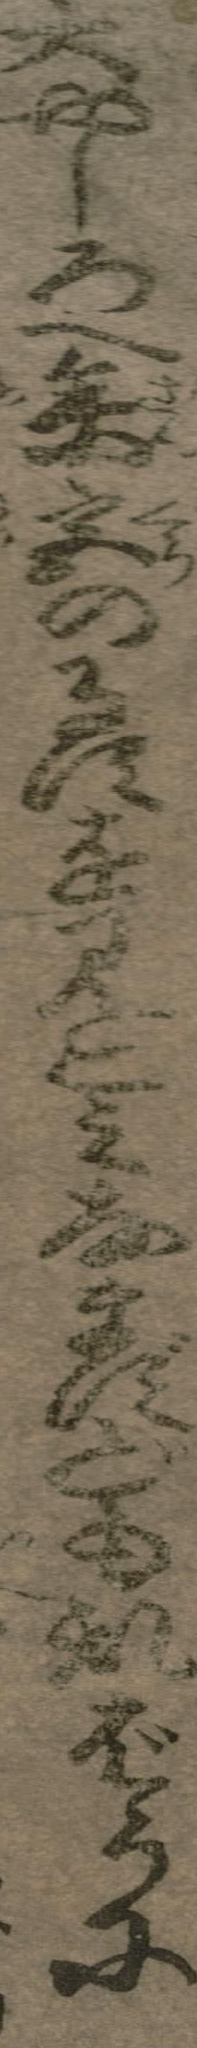大やしろへ参宮のるすをみこみなまずども乱ばうに
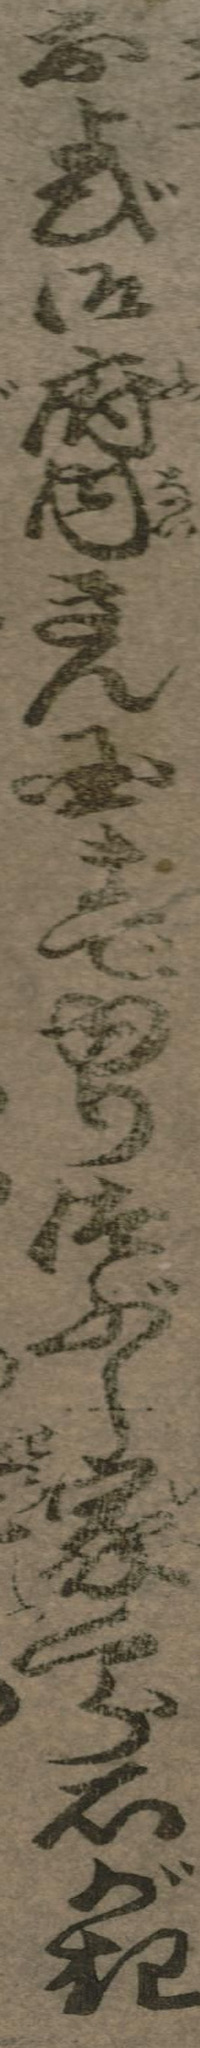および御府内きん国までゆりつぶし家くら石がき
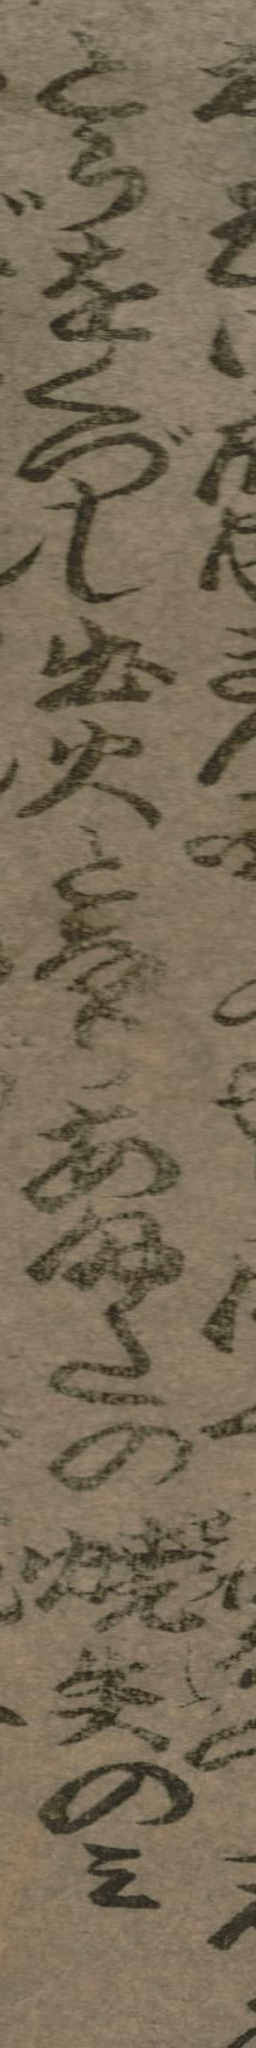とうをくづし出火となりあまたの焼失のみ
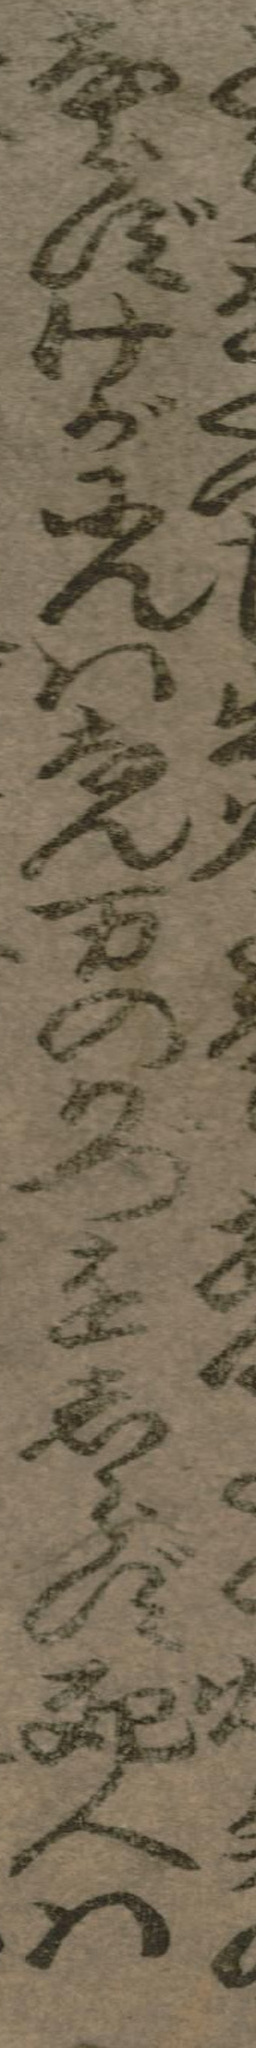ならずけがにんはなん万のかづをしらず死人は
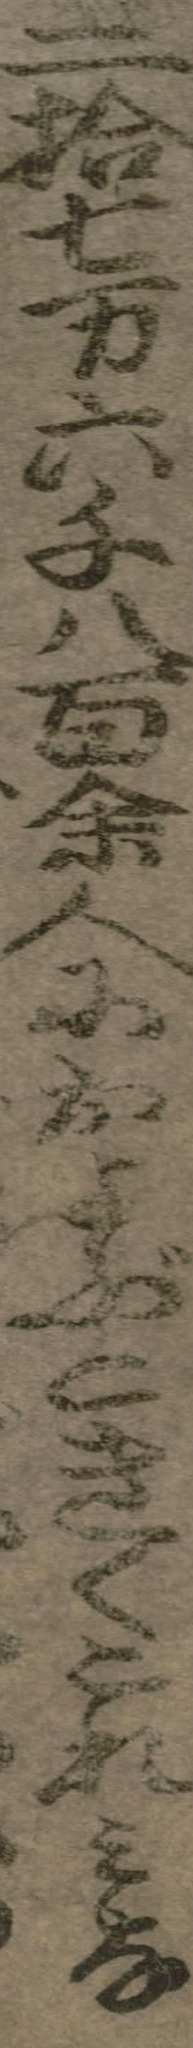二拾七万六千八百余人におよぶときくこれみな
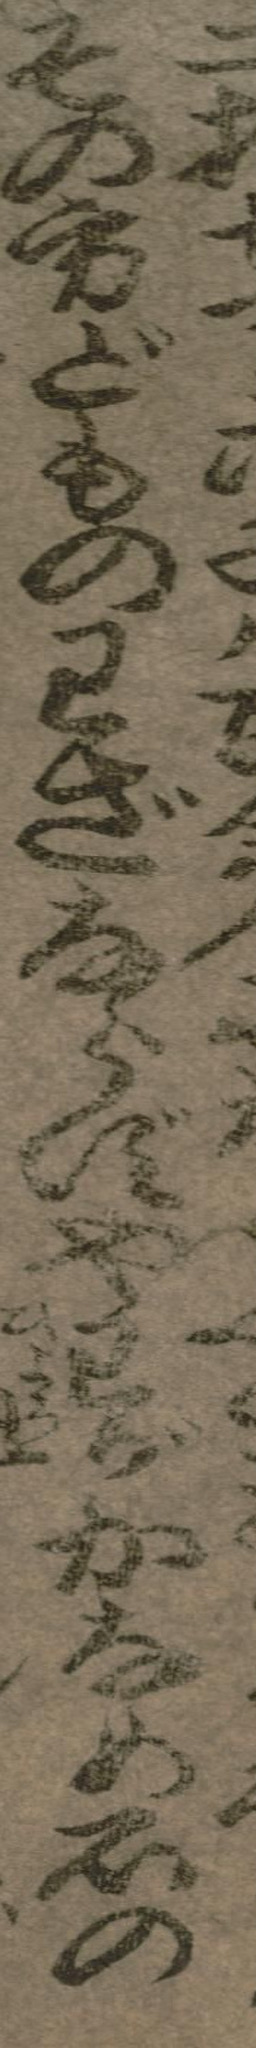その方どものわざならずやわがかなめ石の
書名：[すい神のおしえにいのちたすかりて]
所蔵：東京大学地震研究所図書室 Earthquake Research Institute Library, The University of Tokyo, JAPAN
